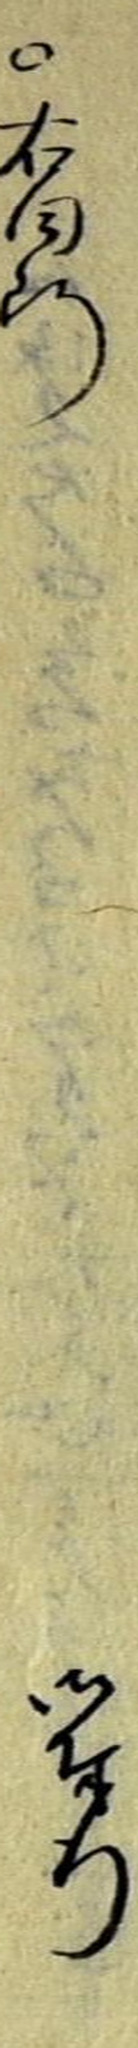○右同断御奉行

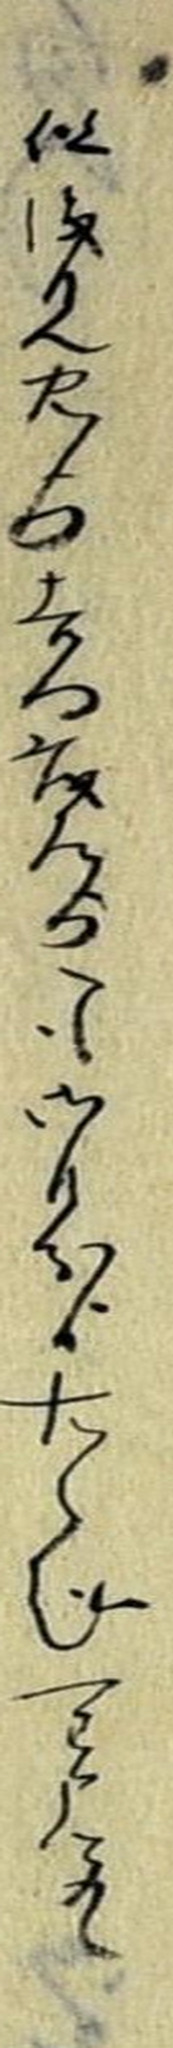但浅見忠右衛門吉田茂左衛門へも御自分ゟ右之趣可被申聞候
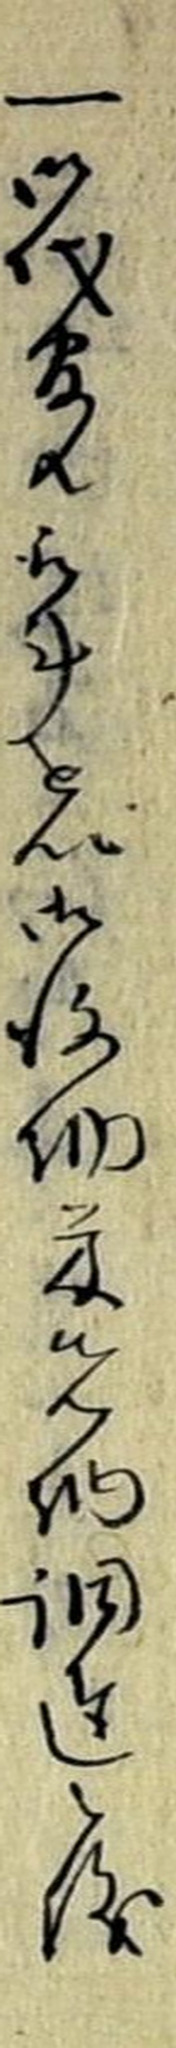一御代官共取斗を以御収納米先納調達之儀
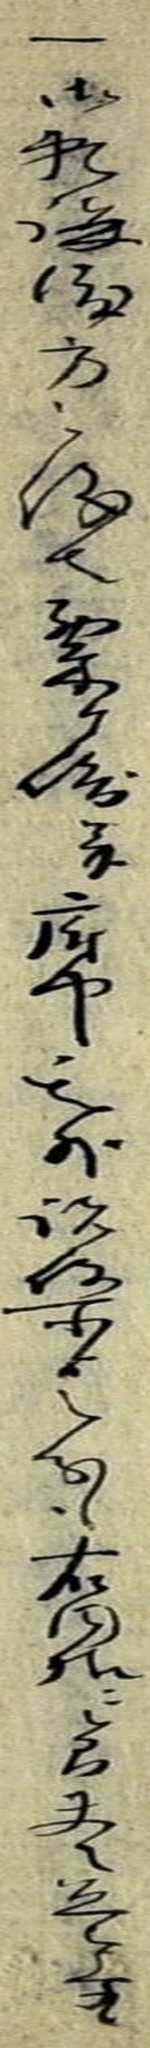一御頼講渡方之儀は粟ヶ崎并府中其外諸役所ゟ之分も右同様に候間夫々宜被申聞候
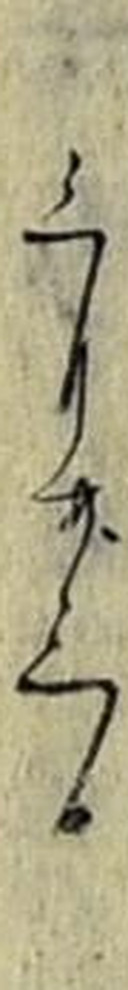三月廿三日
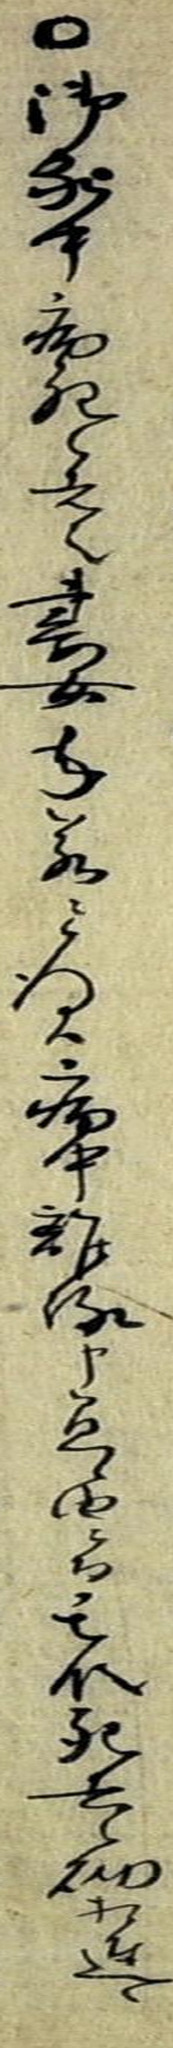○御家中病死之者之妻女年若に候得は病中離縁申置候由に而其段死去之砌相達候
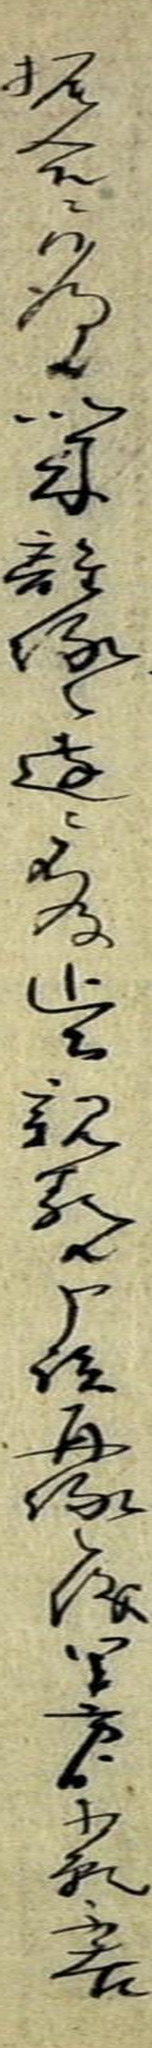振合に候得共以来離縁之達に不及追而親類共申談再縁之儀里方ゟ相願不苦
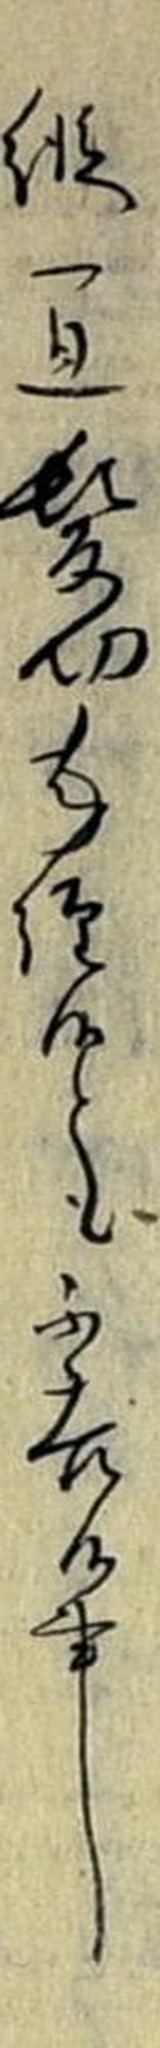段一旦髪切年往候とも不苦候事
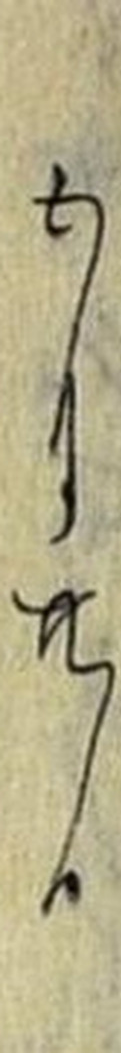五月廿日
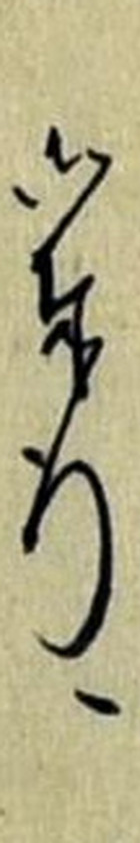御奉行へ
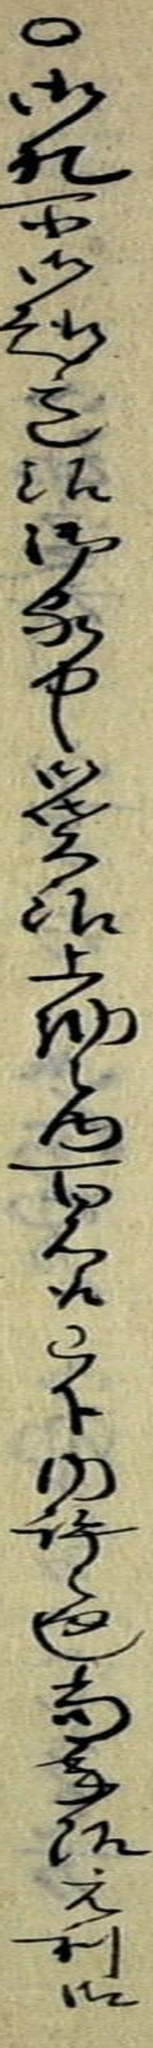○御札所御趣意銀御家中御貸銀上納之内百石取以可内評之通当年銀元利御
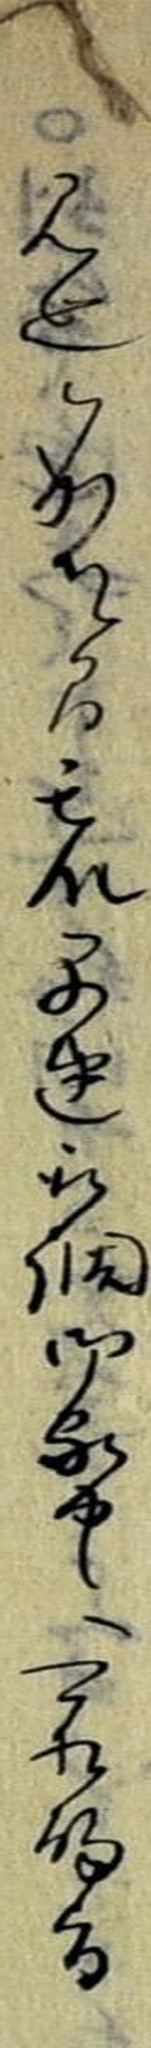見延被成下候間其段早速取調御家中へ可相触旨
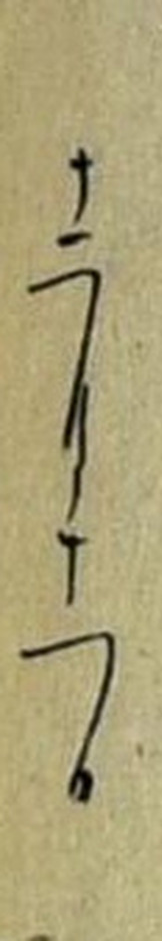十二月十一日
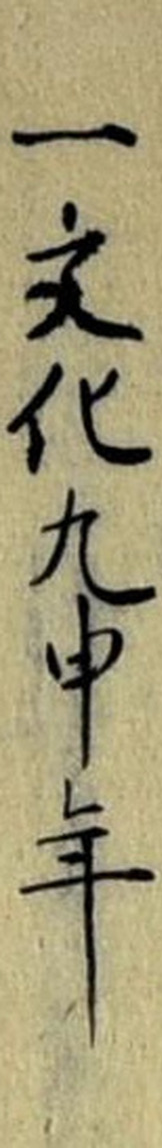一文化九申年
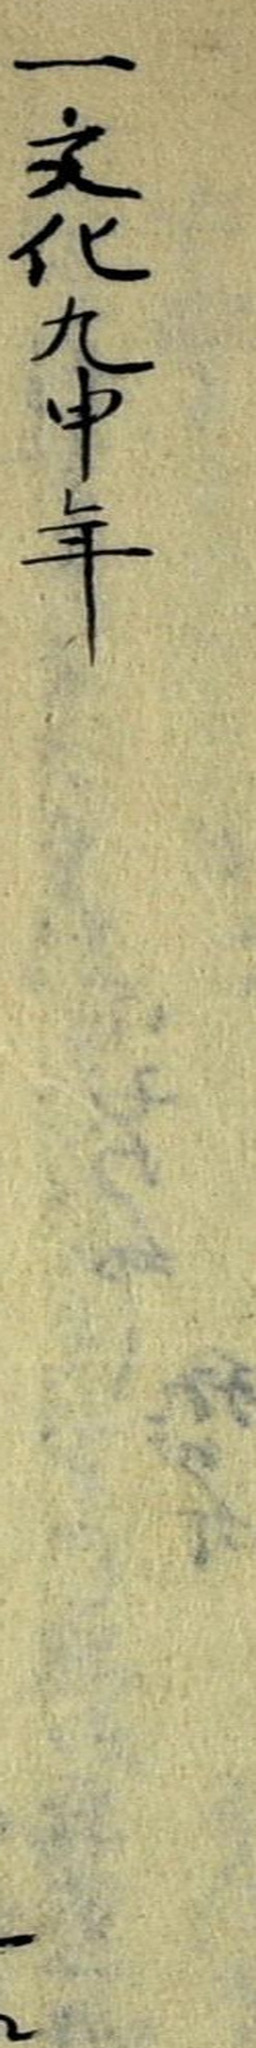一文化九申年
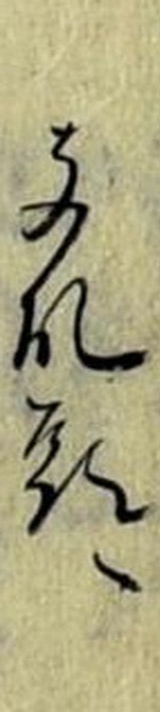支配頭へ
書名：命令之部 四
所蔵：福井県文書館 Fukui Prefectural Archives
